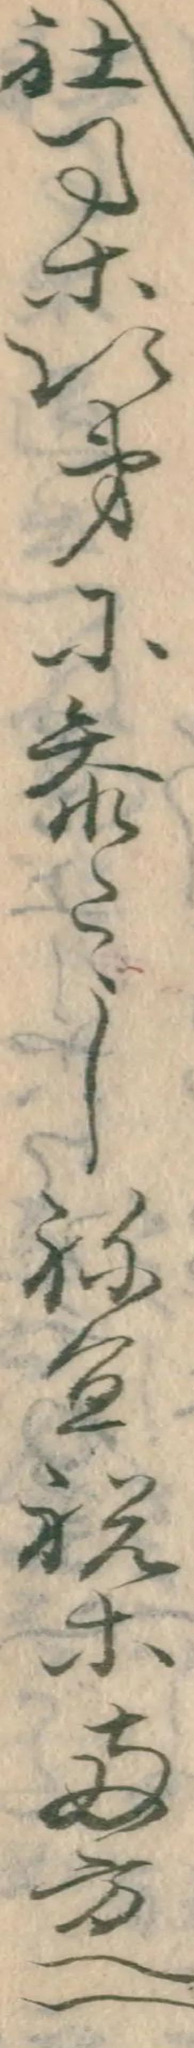社司等次第に参たゞし祢宜祝等両方へ

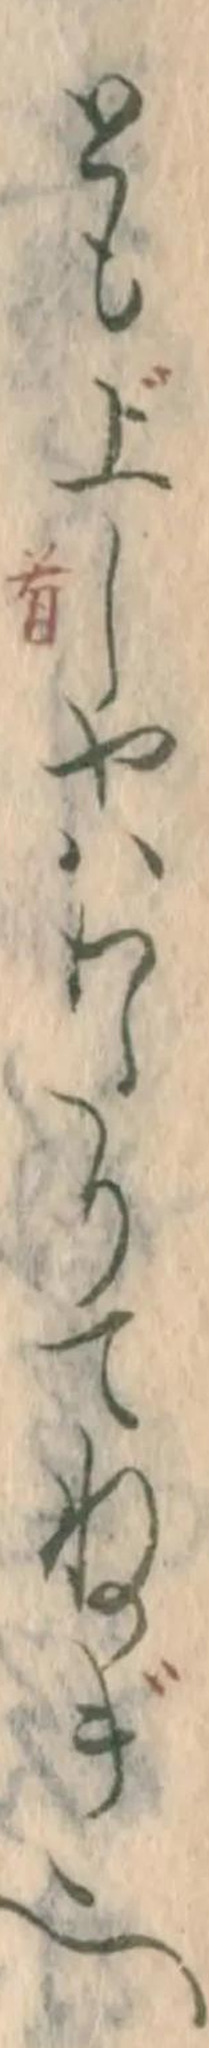とも上しやはわたりてねぎ
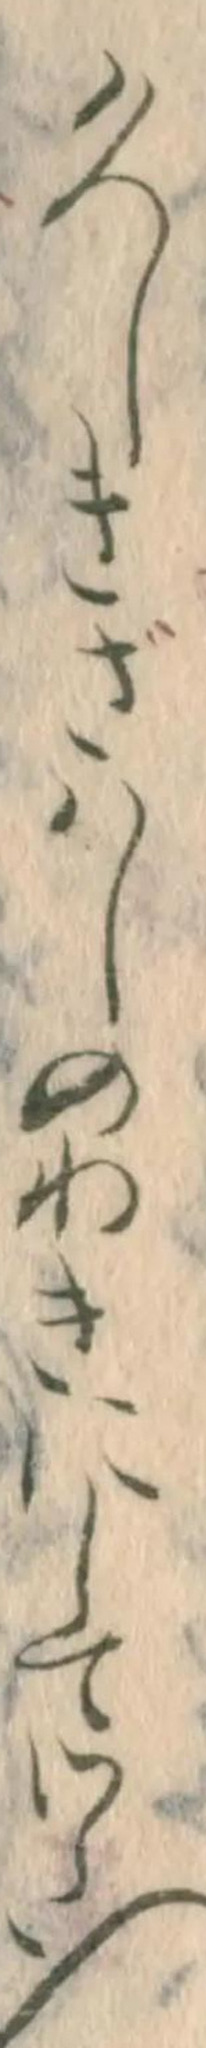久しきざはしのわきにしてわた
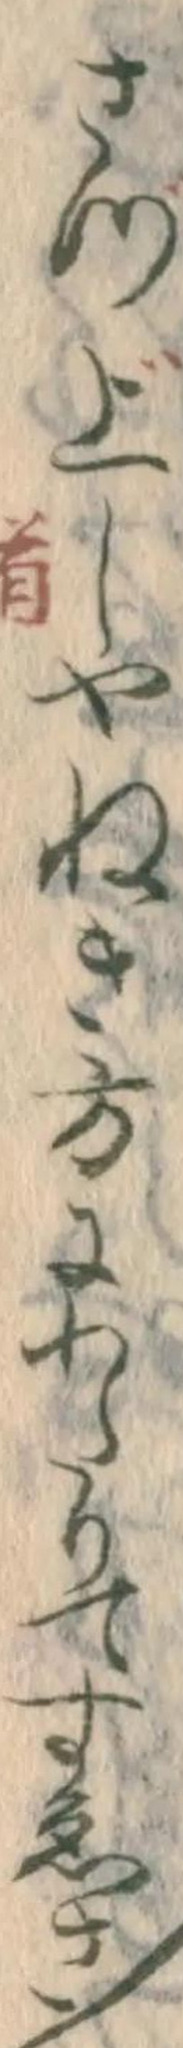さづ上しやねき方にわたりてすゑさ
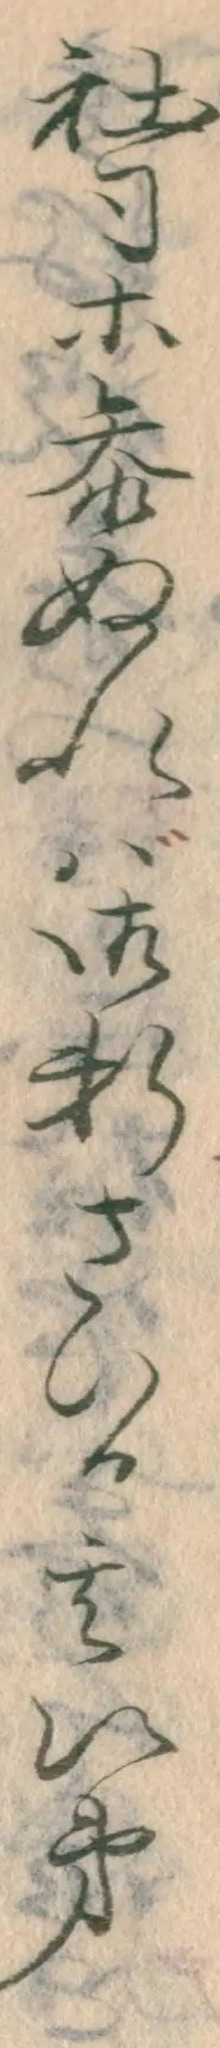社司等参ぬれば御料まひる其次第
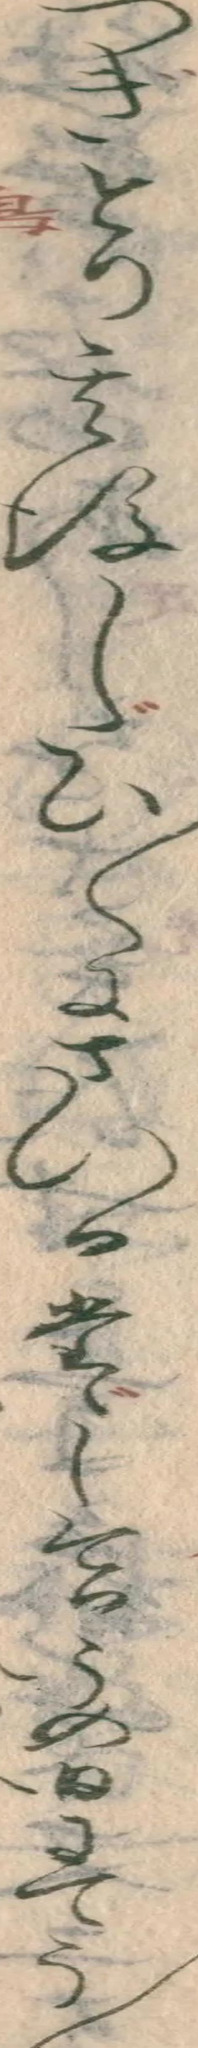つぎとり其後しだひ〳〵にまいるたゞし今日うの日にてう
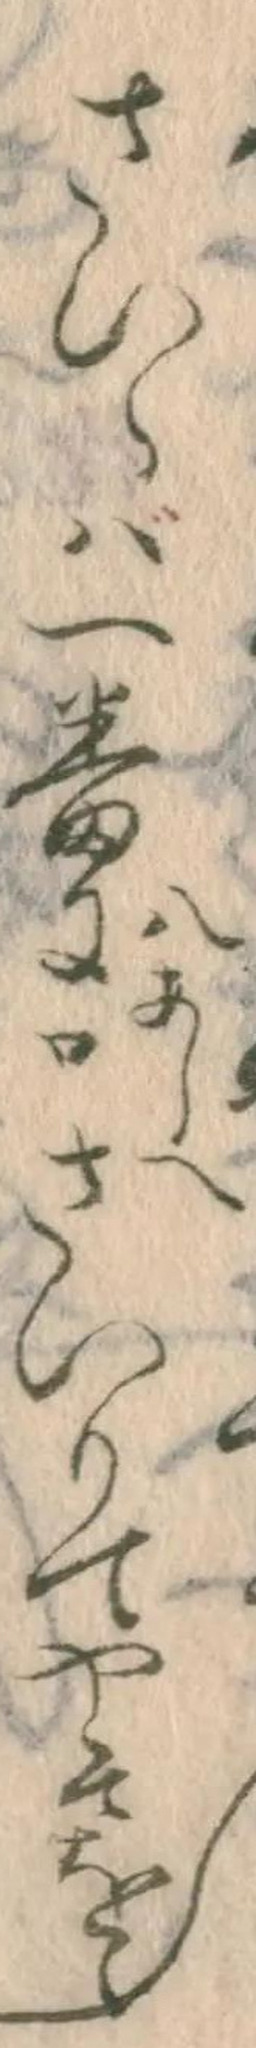まいらば一番に◦まいりてやそを
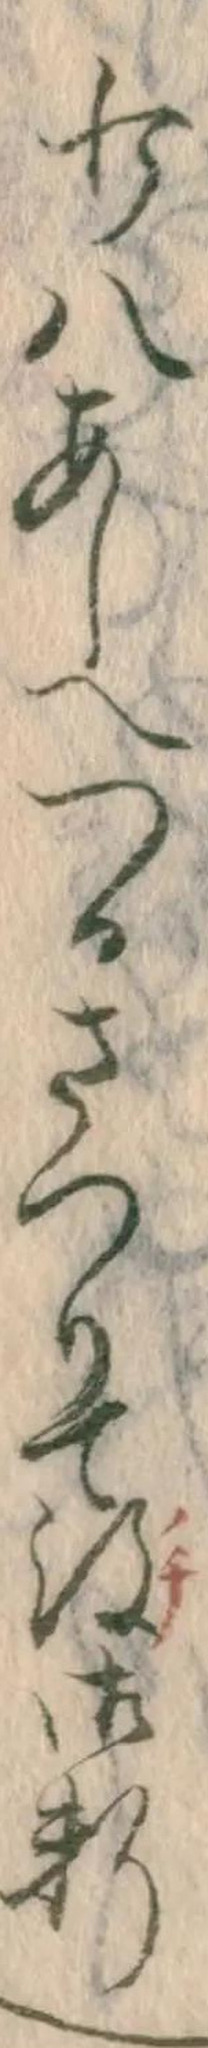打八あしへつるまつりて後御料
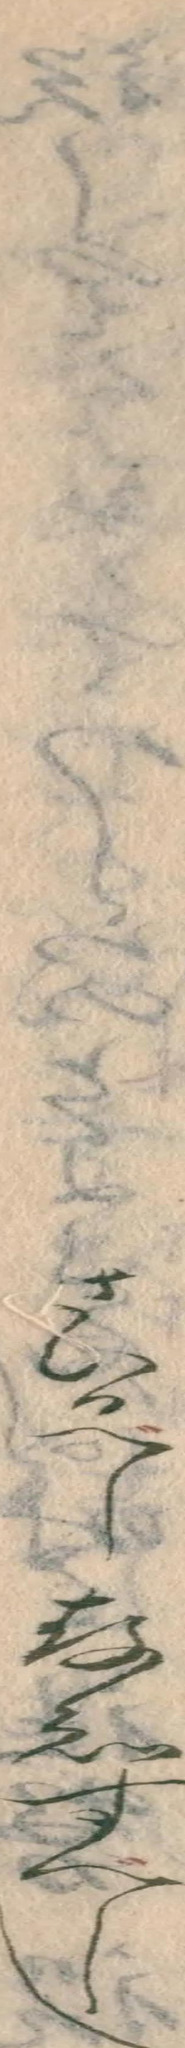まいるべし存知すべし
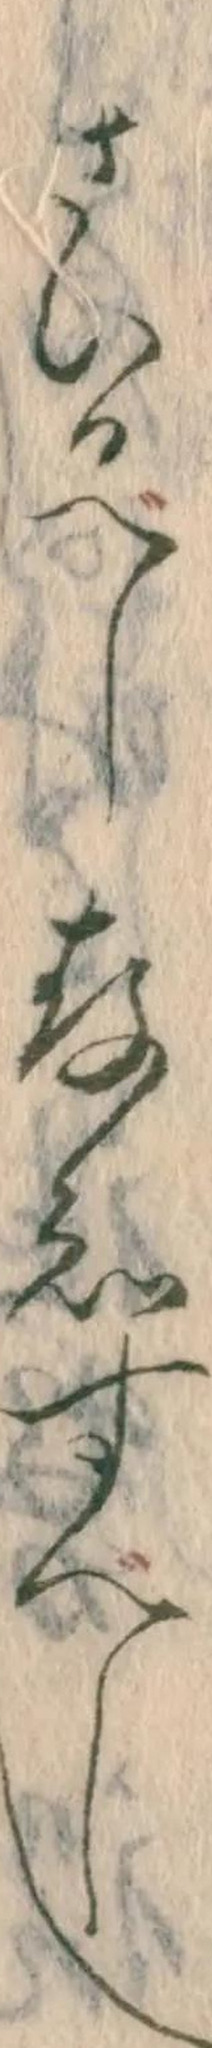まいるべし存知すべし
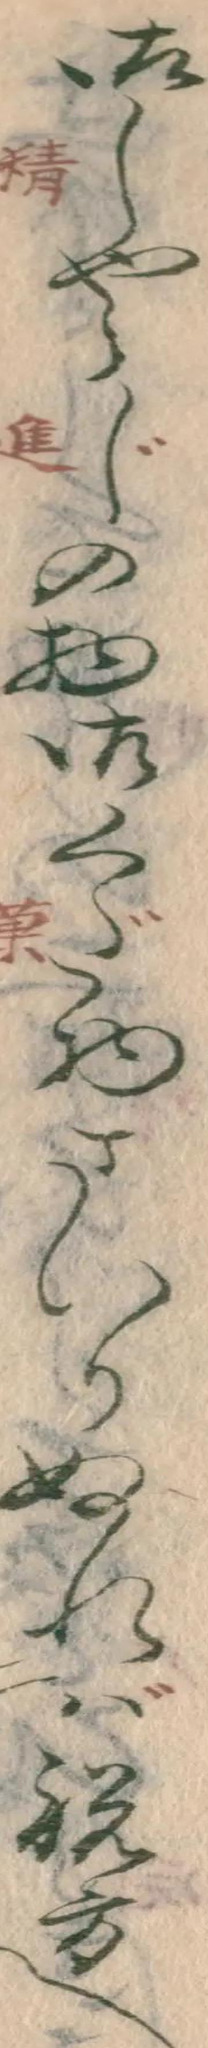御しやうじの物御くだ物まいりぬれば祝方
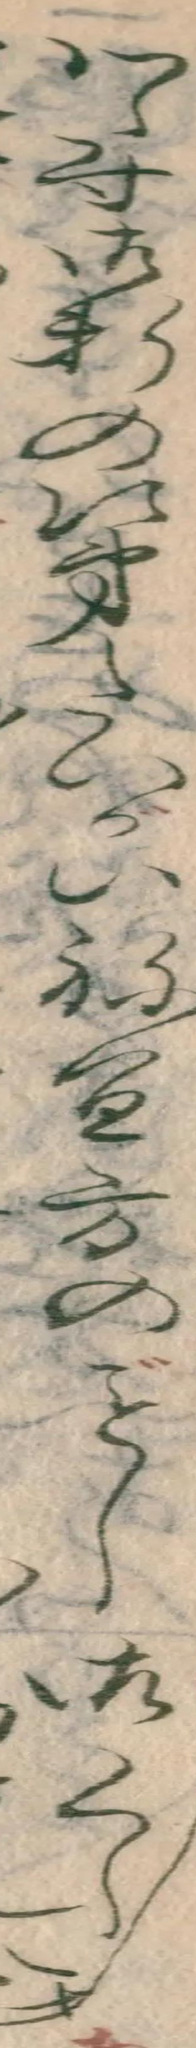わたす御料の次第たいがい祢宜方のごとし御くし物
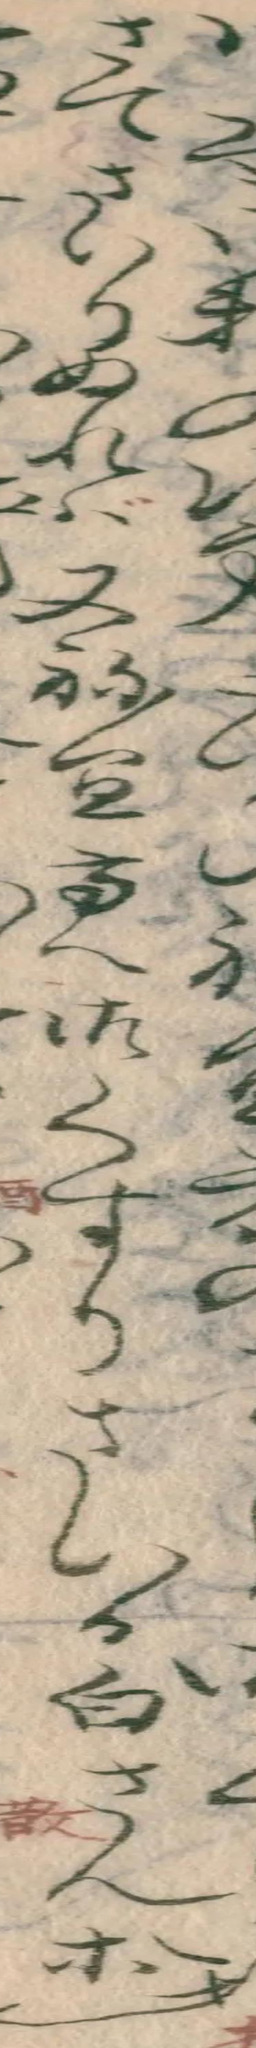まてまいりぬれば又祢宜方へ御くすりまいる白さん等
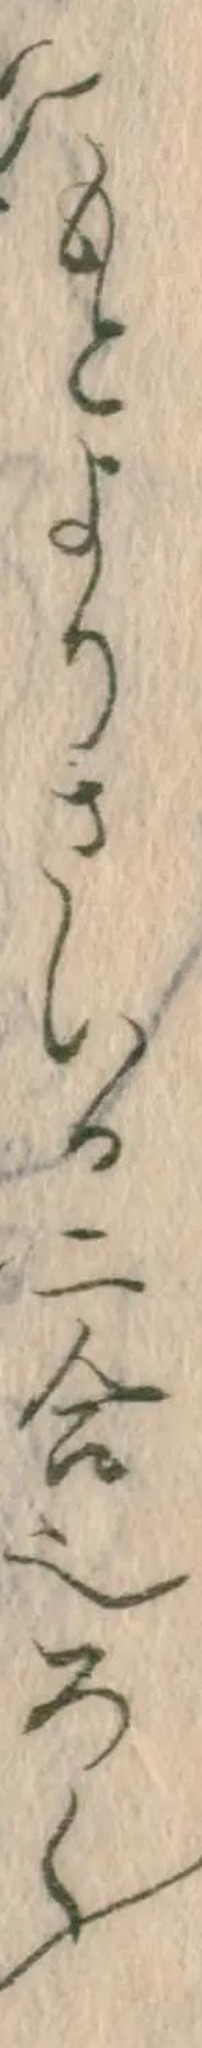もとよりまいる二合也ろく
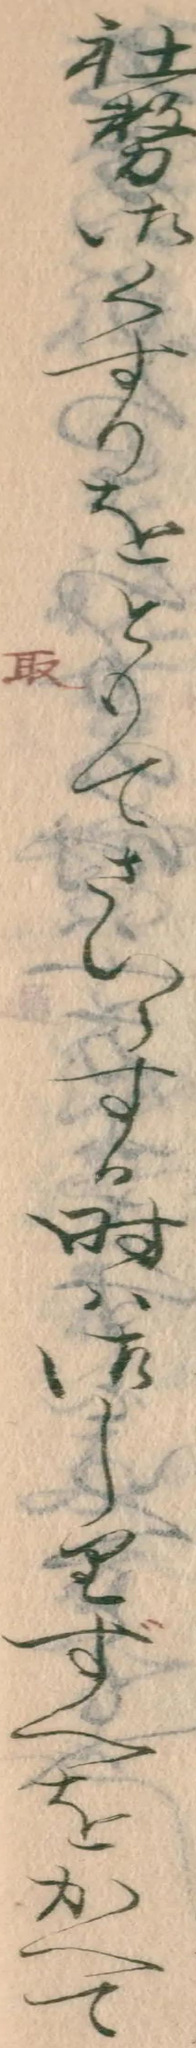社務御くすりをとりてまいらする時は御しりずへをかへて
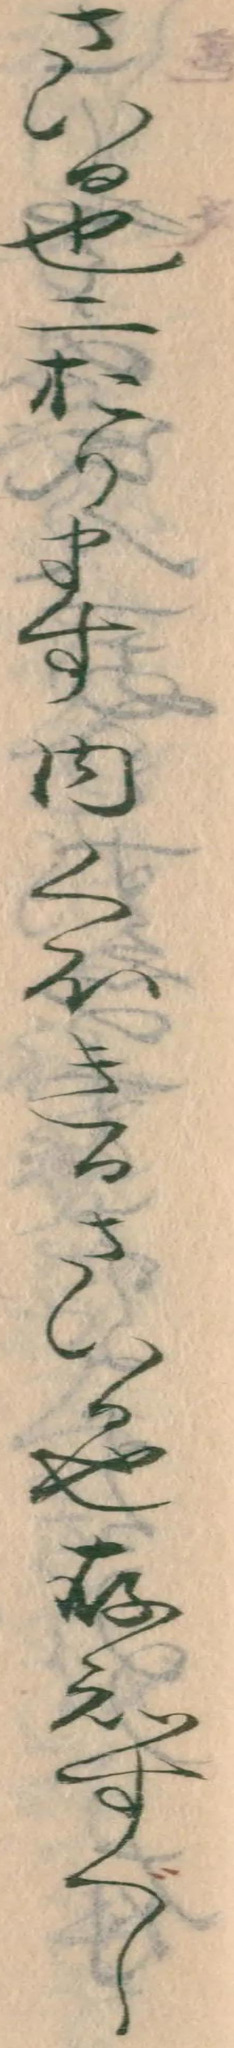まいる也二おります内くほきるまいる也存知すべし
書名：賀茂社記録. 第3冊
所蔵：国立国会図書館 National Diet Library, JAPAN
